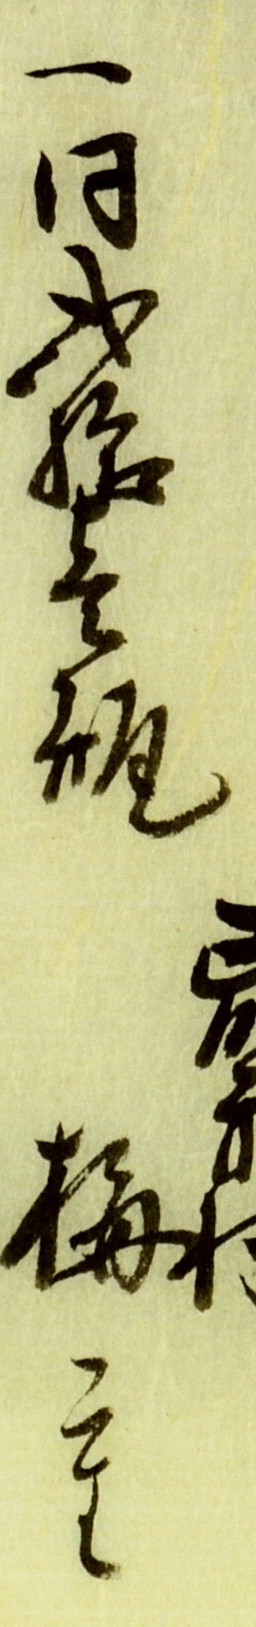一同弐拾壱瓶栴重
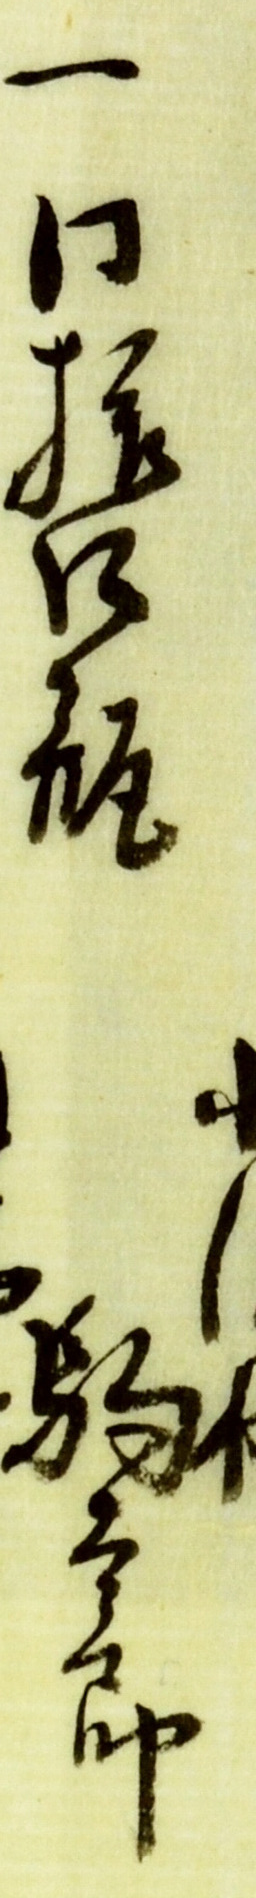一同拾四瓶駒太郎
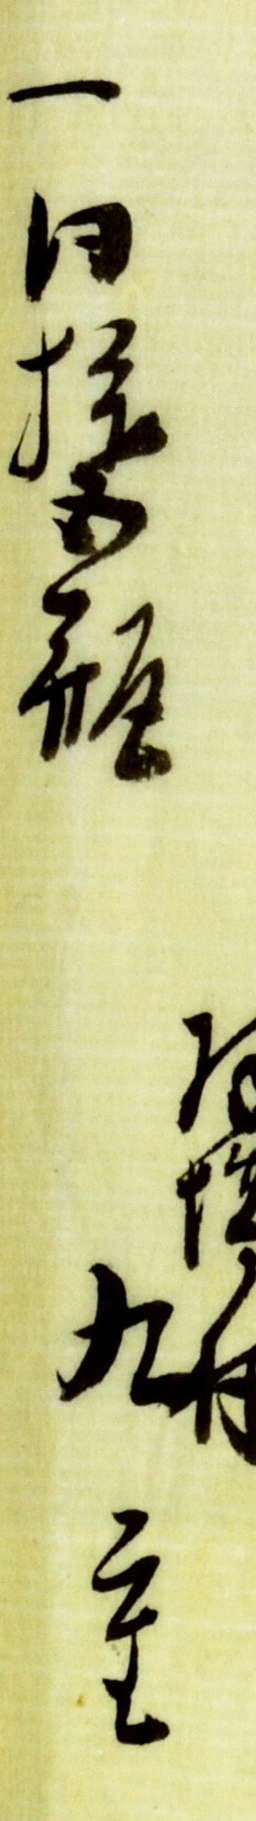一同拾五瓶九重
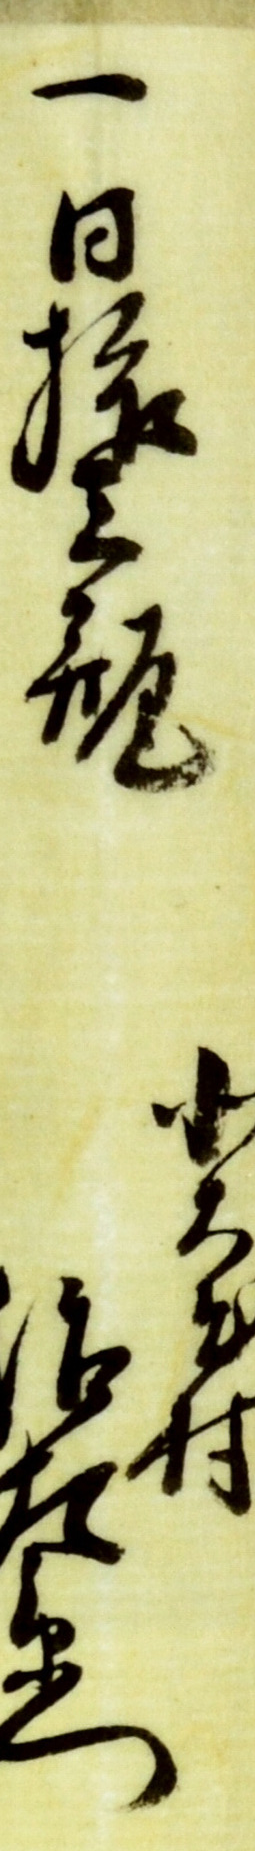一同拾五瓶重左衛門

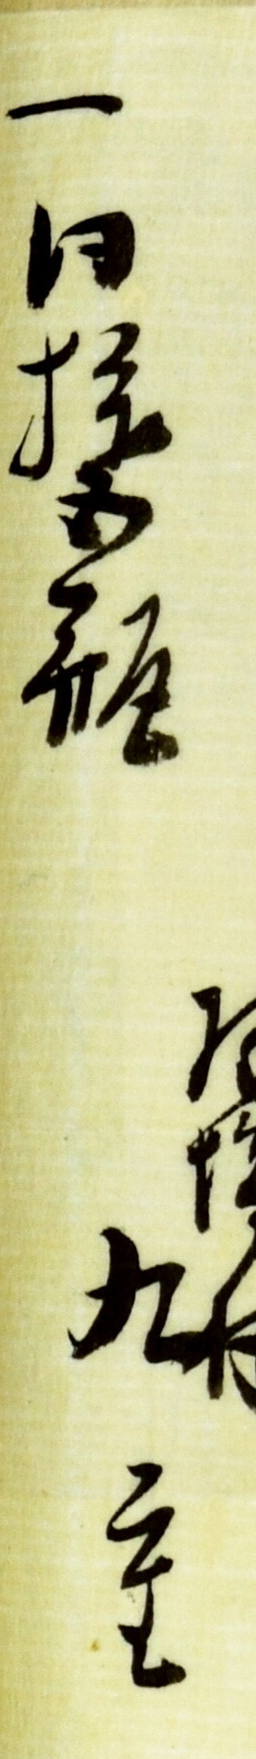一同拾壱瓶喜重
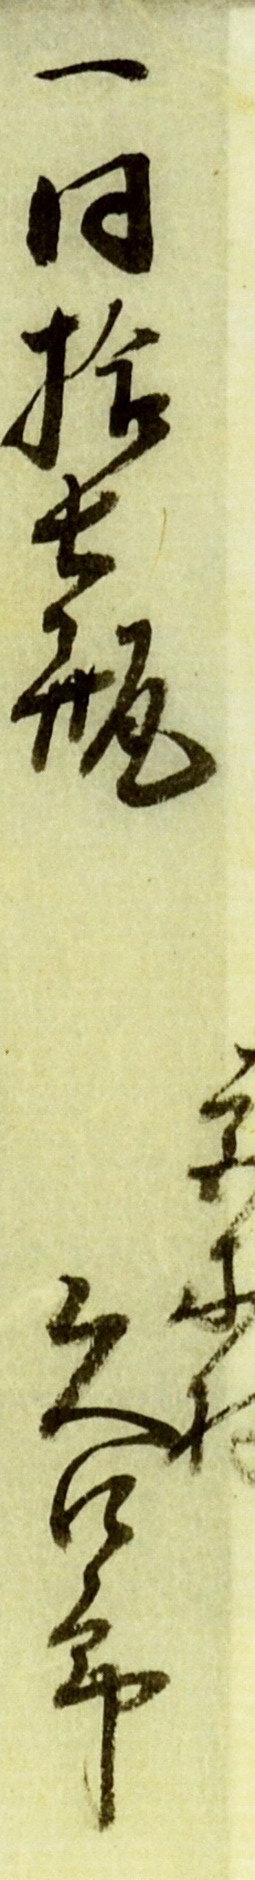一同拾七瓶久四郎
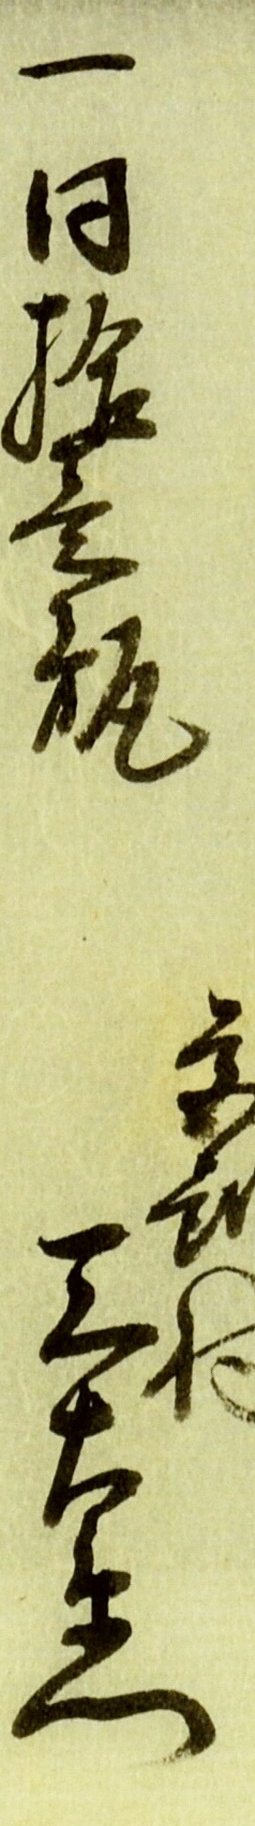一同拾壱瓶三右衛門
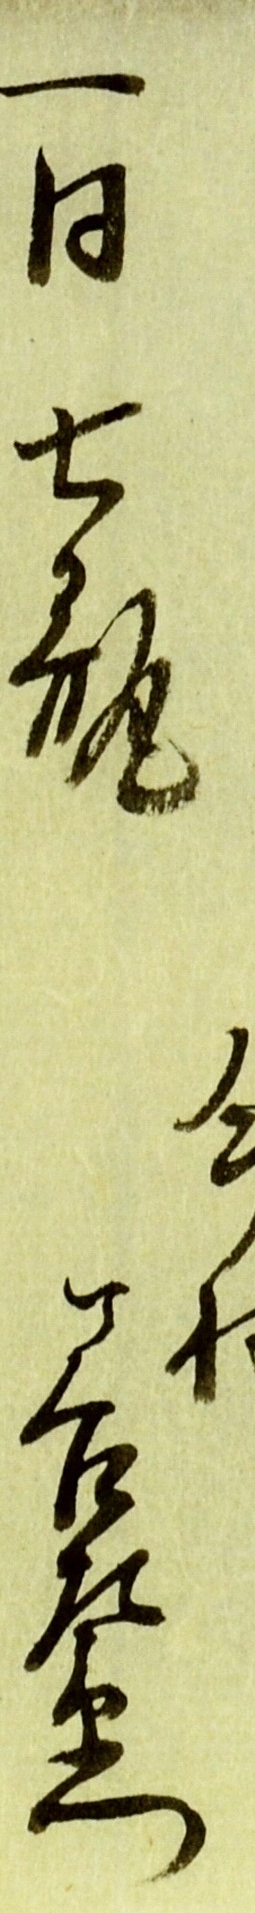一同七瓶善左衛門
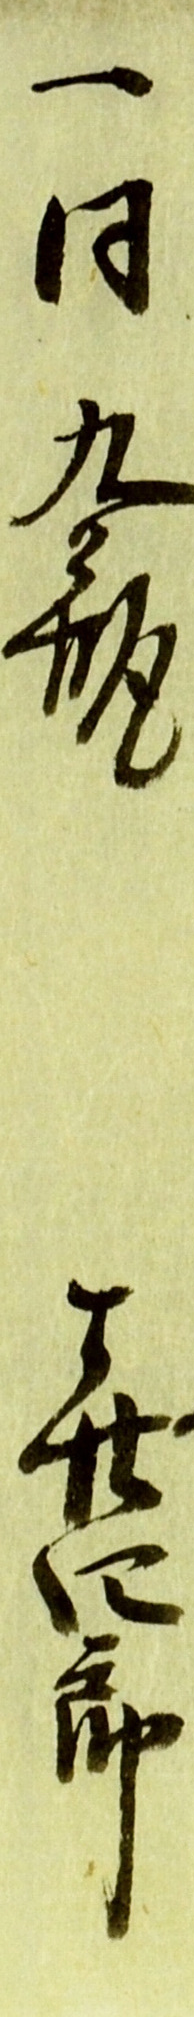一同九瓶喜四郎
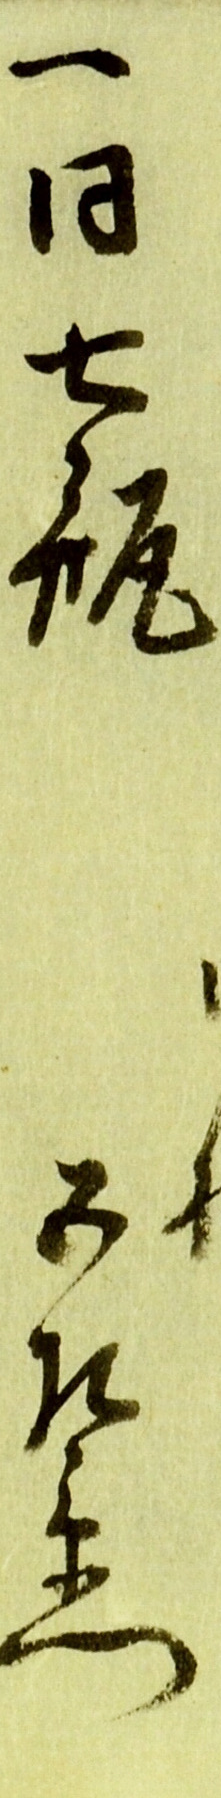一同七瓶五左衛門
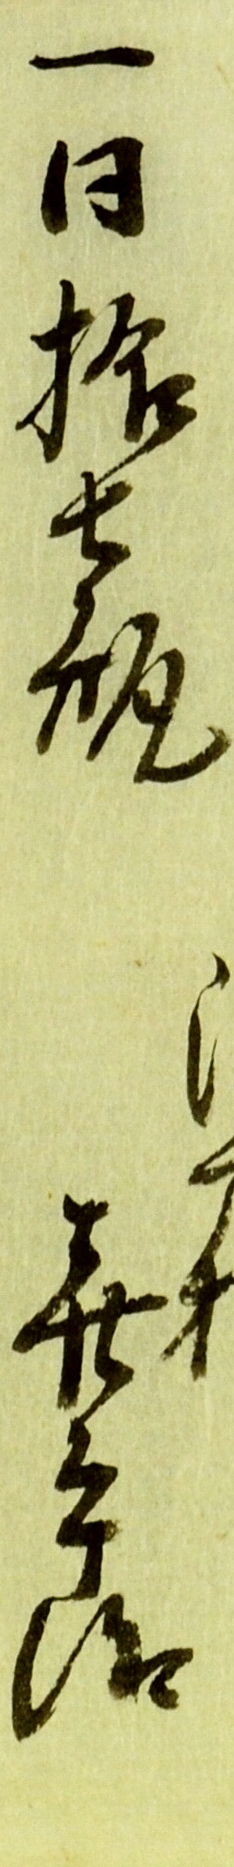一同拾七瓶喜平治
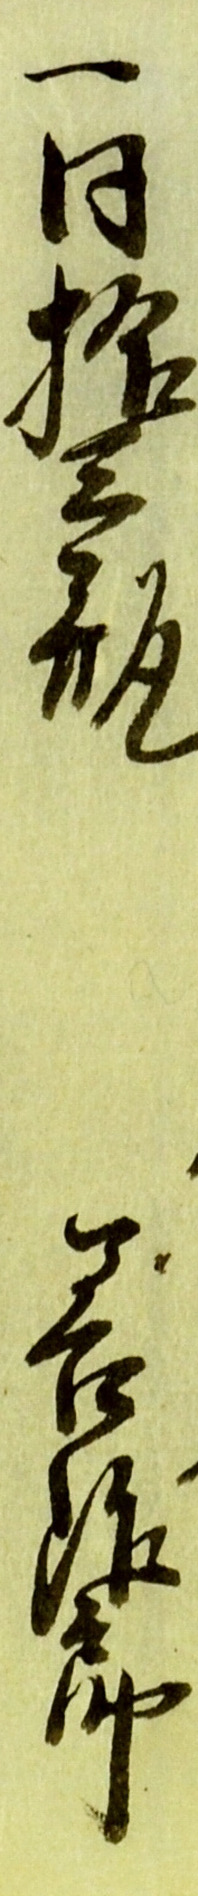一同拾三瓶善治郎
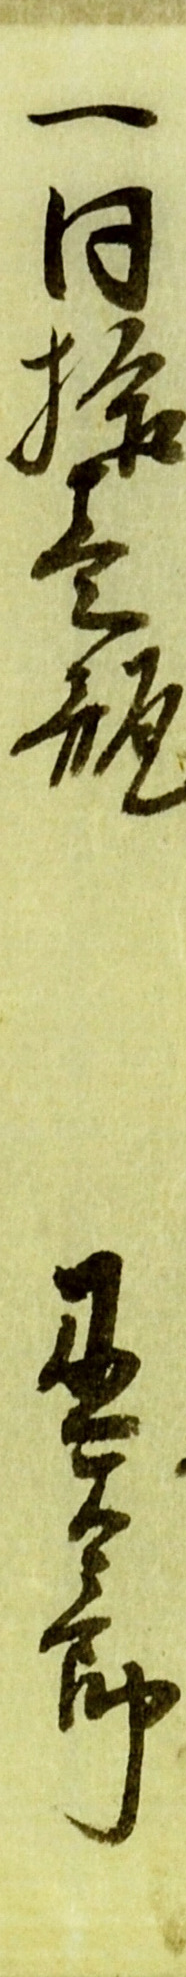一同拾壱瓶丑太郎
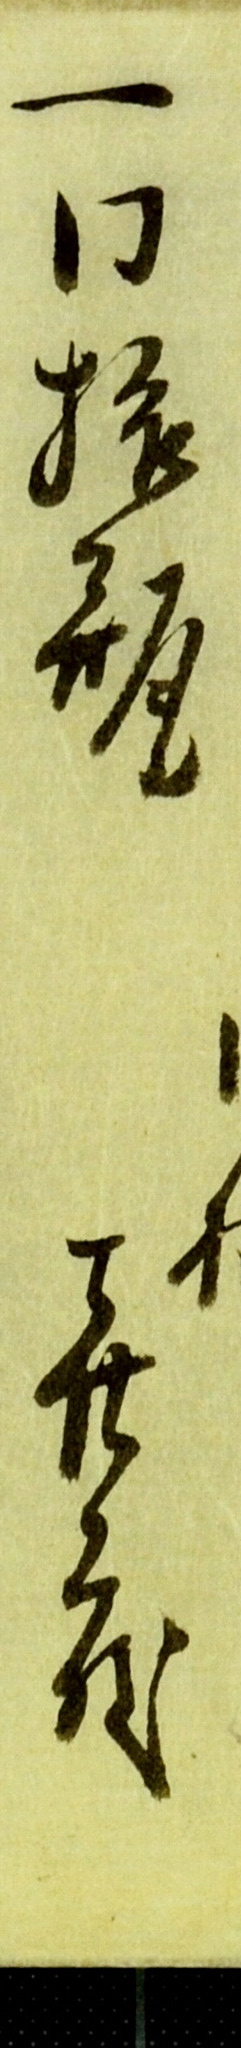一同拾瓶喜蔵

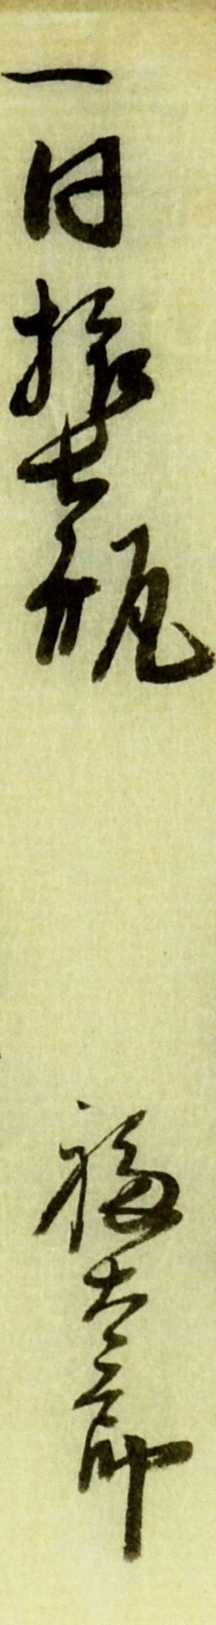一同拾七瓶福太郎
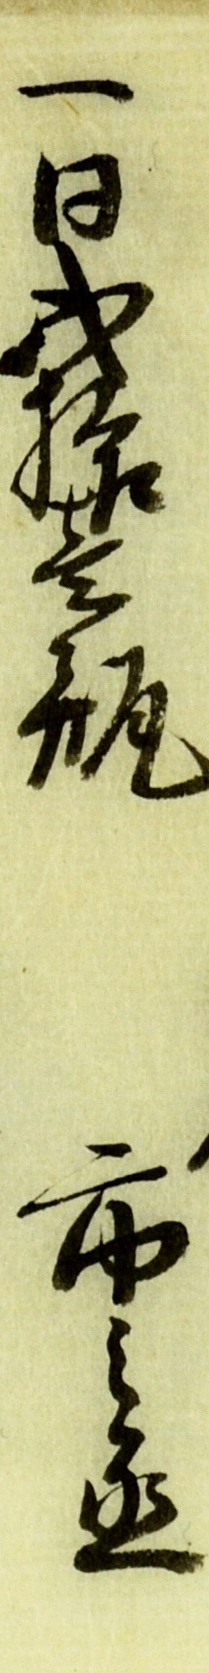一同弐拾壱瓶市之烝
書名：御領分中御領分中紺屋藍瓶員数御改帳
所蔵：伊那市立高遠町図書館・合同会社AMANE
